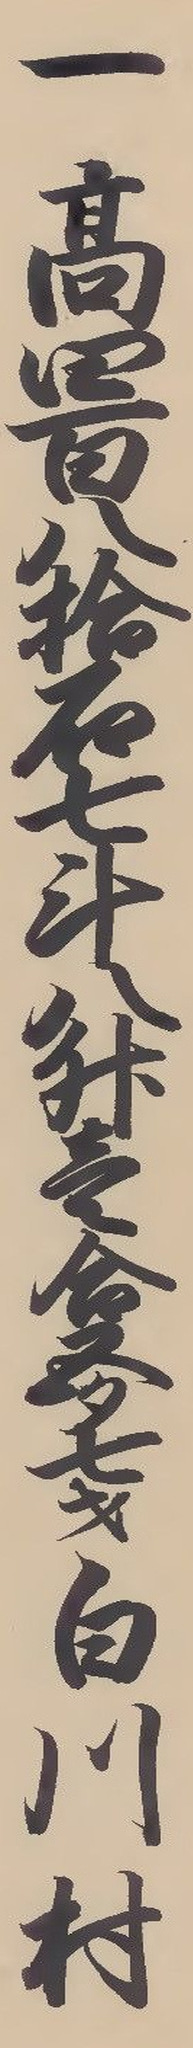一高四百八拾石七斗八升壱合五勺七才白川村
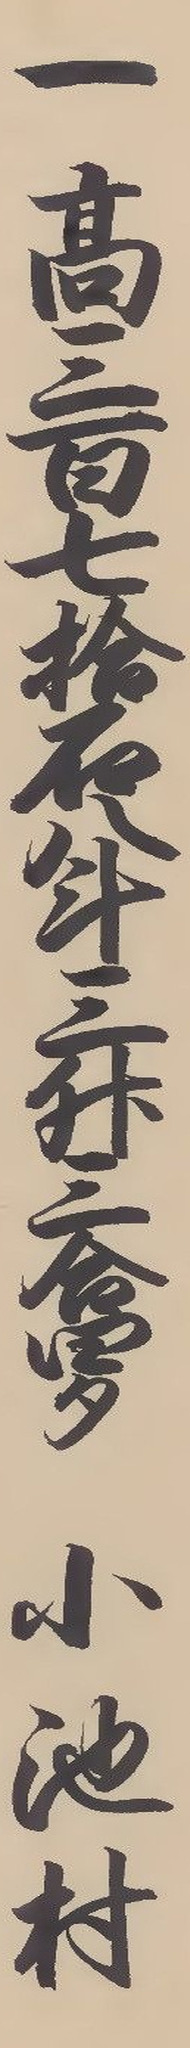一高三百七拾石八斗三升三合四勺小池村
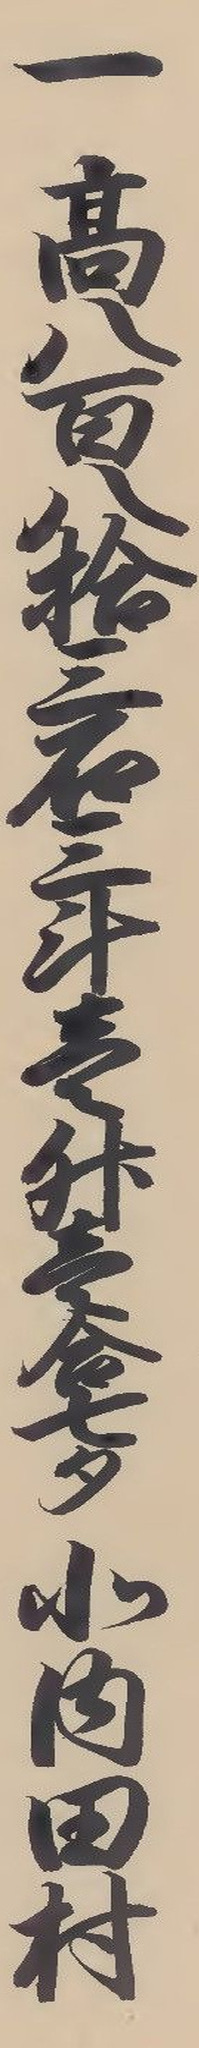一高八百八拾三石三斗壱升壱合七勺北内田村
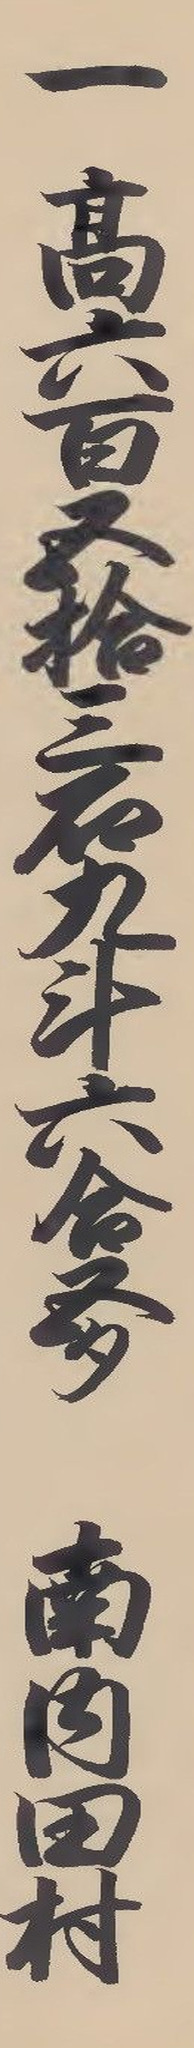一高六百五拾三石九斗六合五勺南内田村
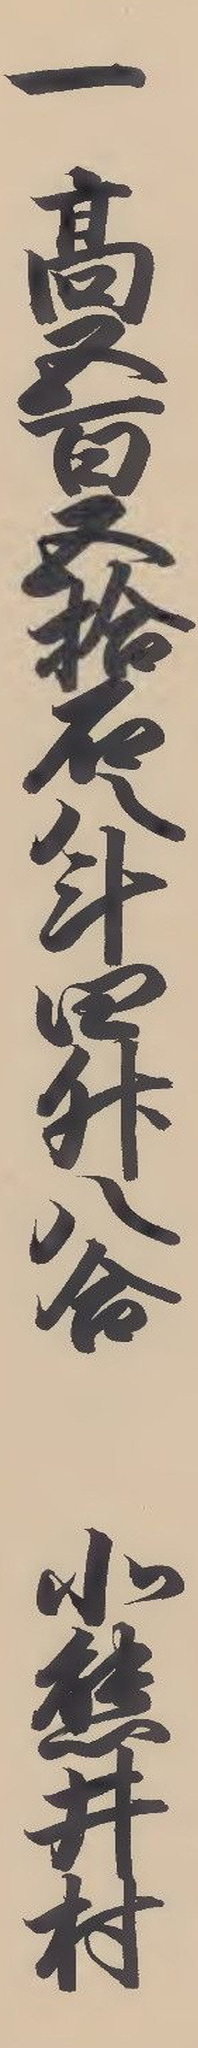一高五百五拾石八斗四升八合北熊井村
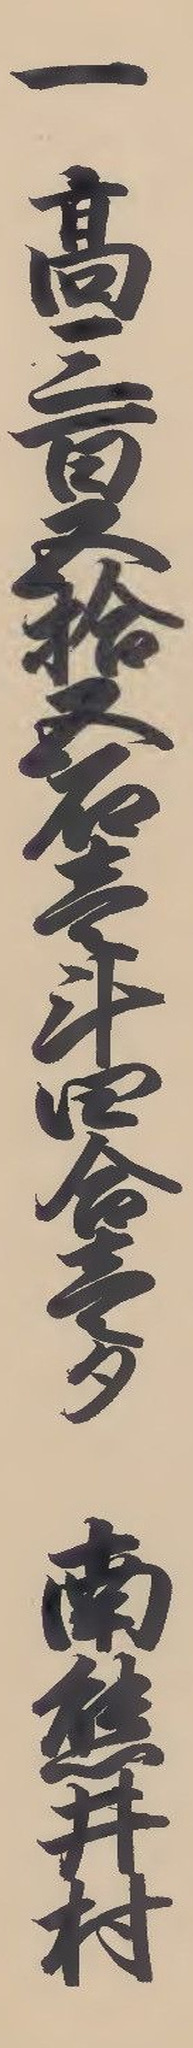一高三百五拾五石壱斗四合壱勺南熊井村

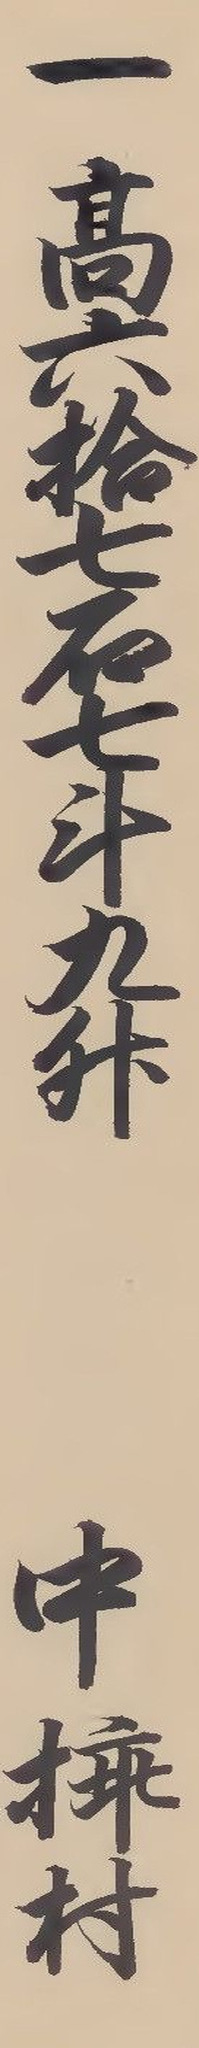一高六拾七石七斗九升中挾村
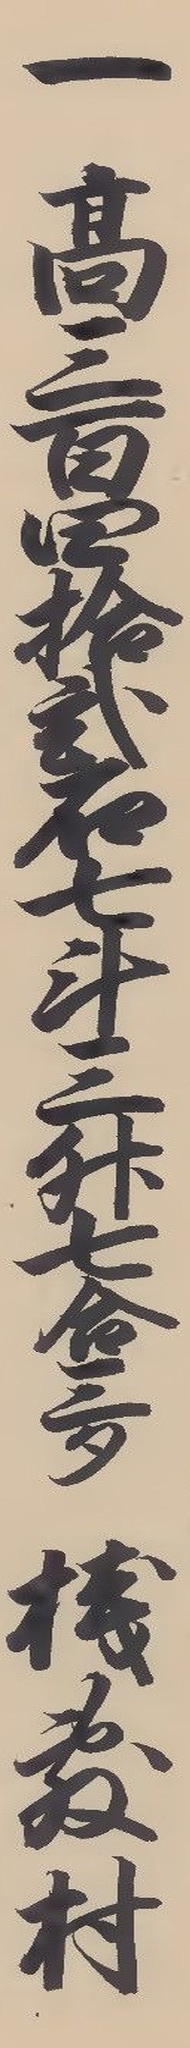一高三百四拾弐石七斗三升七合三勺桟敷村
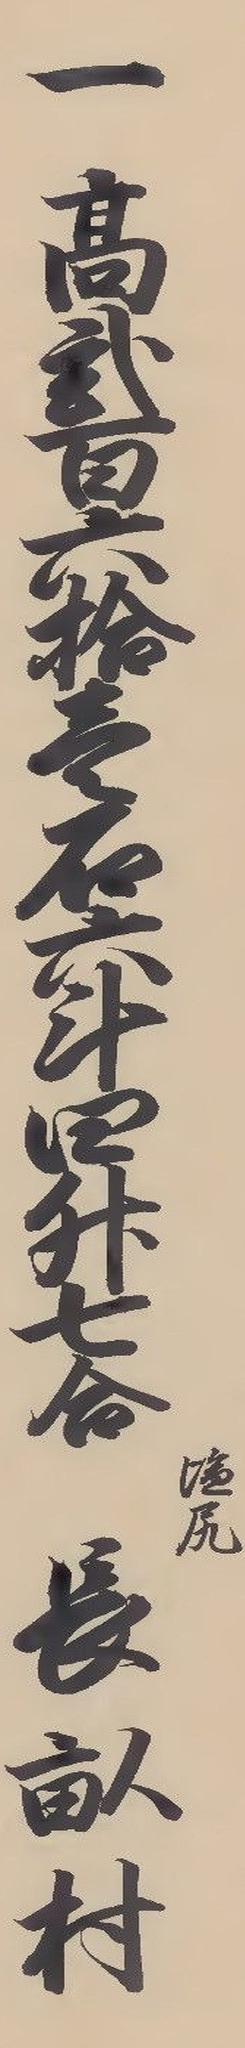一高弐百六拾壱石六斗四升七合長畝村
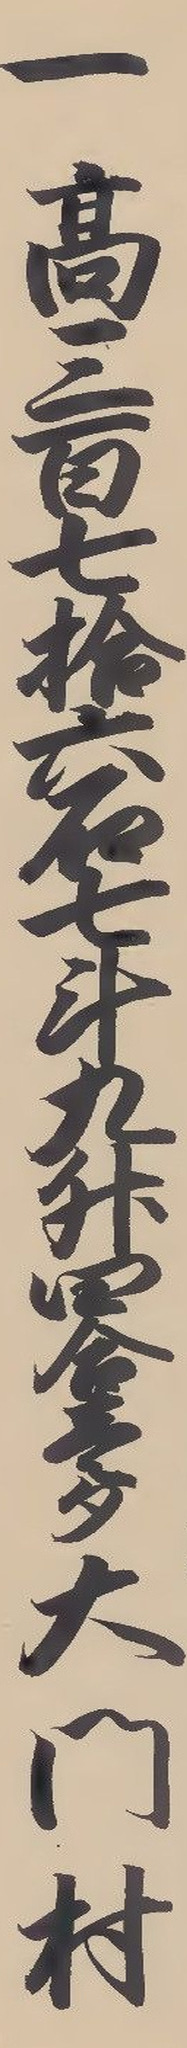一高三百七拾六石七斗九升四合壱勺大門村
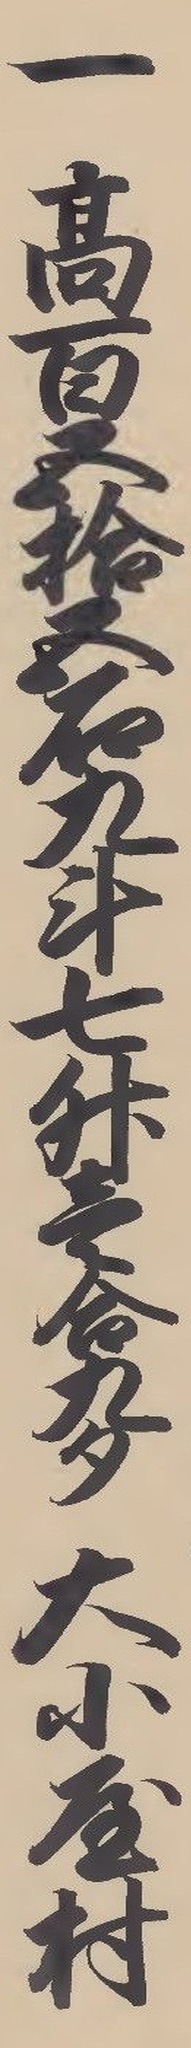一高百五拾五石九斗七升壱合九勺大小屋村
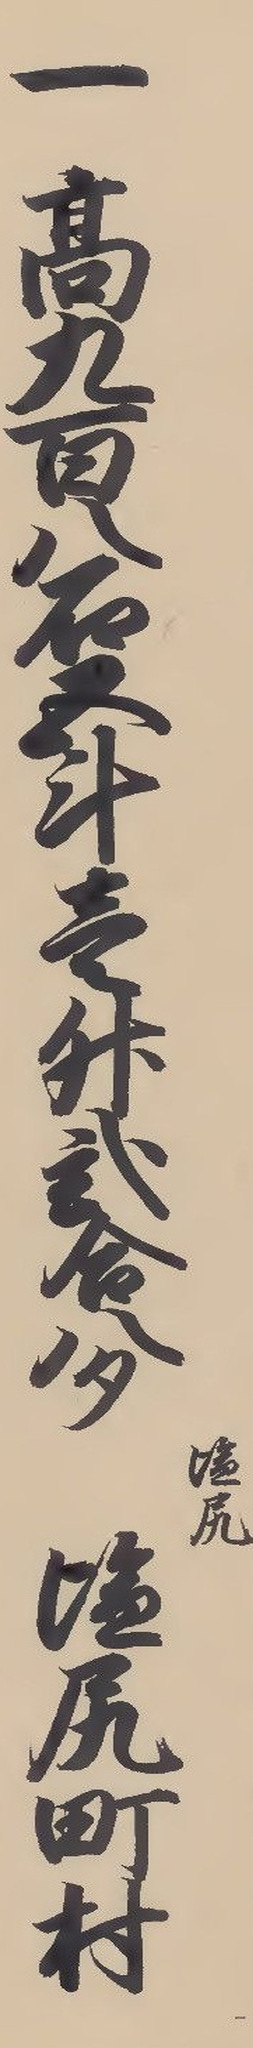一高九百八石五斗壱升弐合八タ塩尻町村
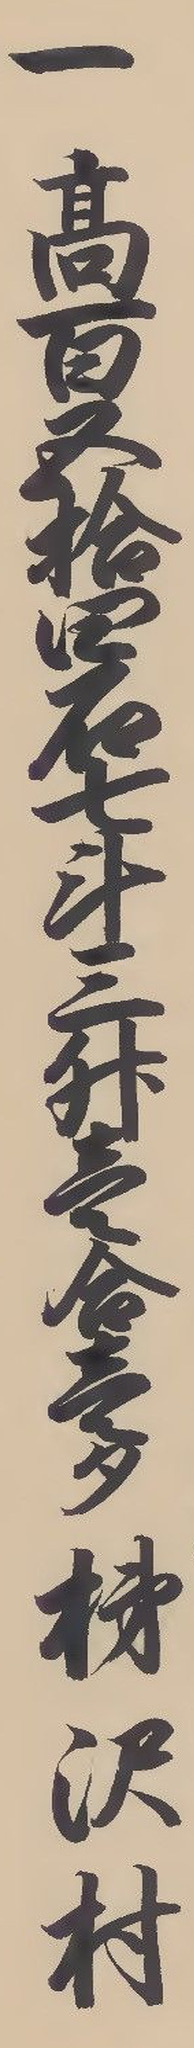一高百五拾四石七斗三升壱合壱勺柿沢村

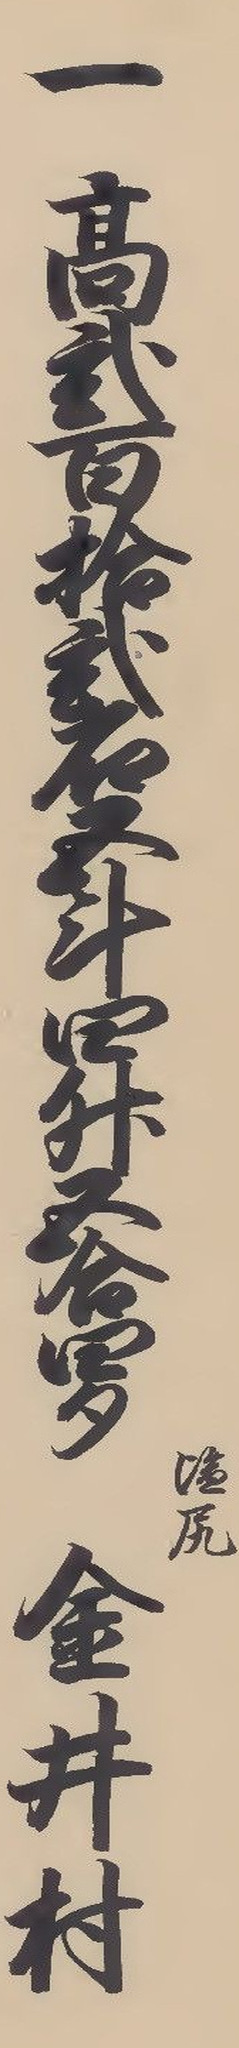一高弐百拾弐石五斗四升五合四勺金井村
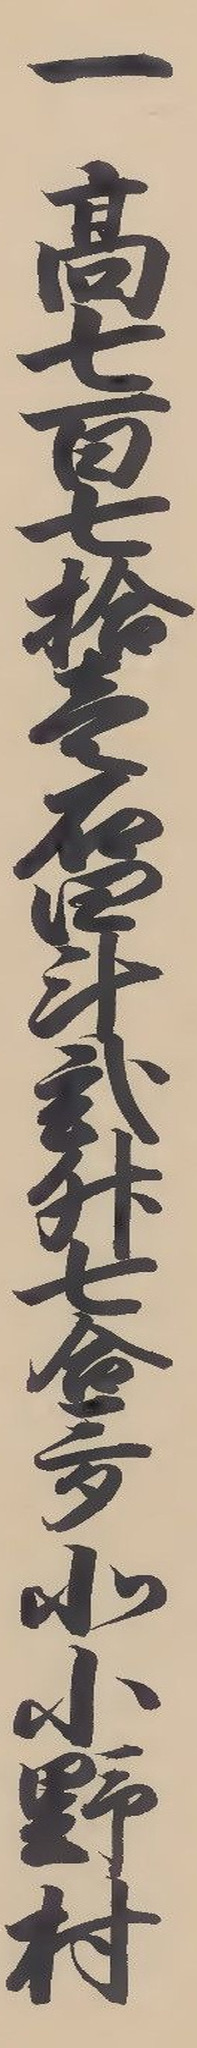一高七百七拾壱石四斗弐升七合三勺北小野村
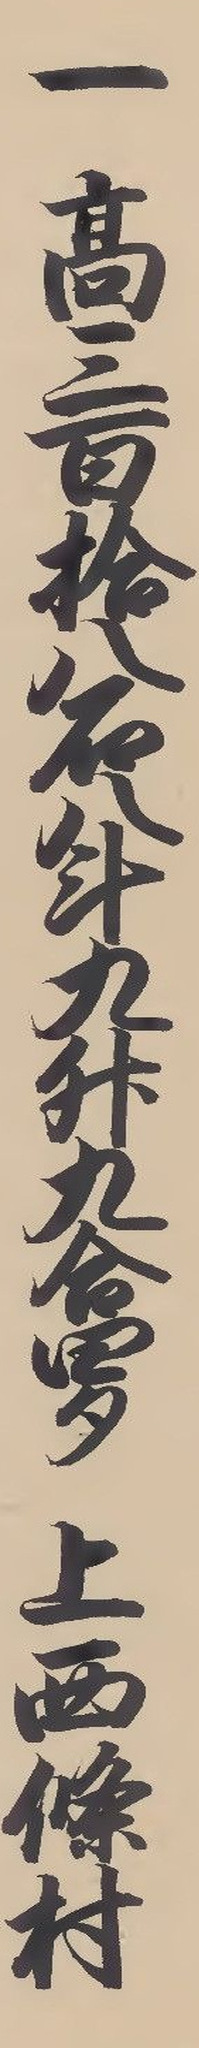一高三百拾八石八斗九升九合四勺上西条村
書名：信濃国郷帳
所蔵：国立公文書館 National Archives of Japan
